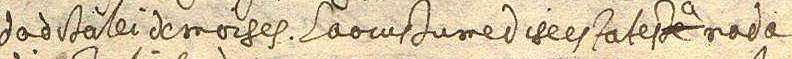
da dita lei de moises. E ao custume dise esta testa nada
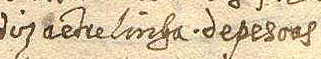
diz a ētrelinha. de pesoas
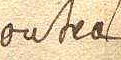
outra
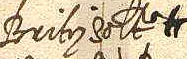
Britiz soltra
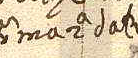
p̄ma 2a da R.
